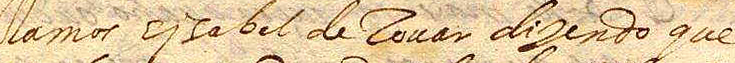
Ramos E jsabel de Touar dizendo que
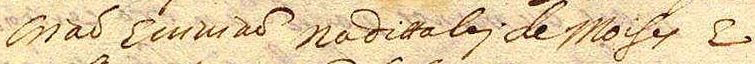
criaõ E uiuiaõ na ditta lej de moises E
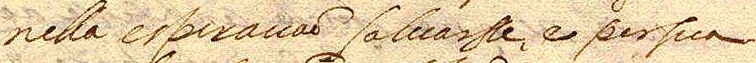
nella esperauaõ saluarsse, e per sua
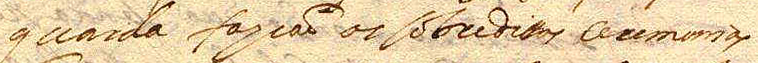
guarda faziaõ as sobredittas ceremonias
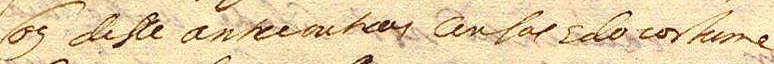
o q̄ disse antre outras cousas E do costume
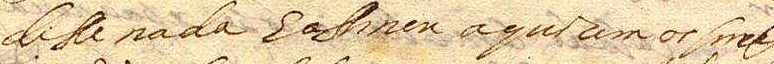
disse nada E assinou aqui com os snres̄
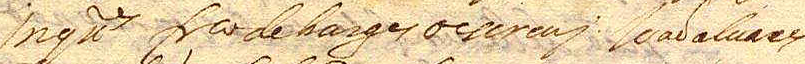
Jnqures frco de burges o escreuj Ioaõ aluares
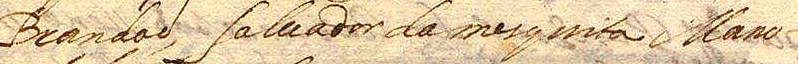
Brandaõ, Saluador da mesquita Manoe
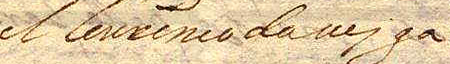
el lourenço da uejga
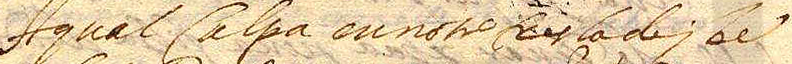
A qual Culpa eu notro tresladej bē
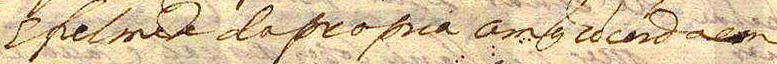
E fielmēte da propria com q̄ cōcorda em
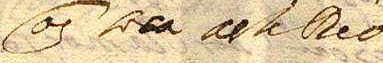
o q̄ toca a ele Reo
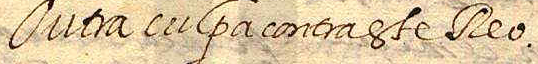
Outra culpa contra este Reo.
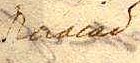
Relaçaõ
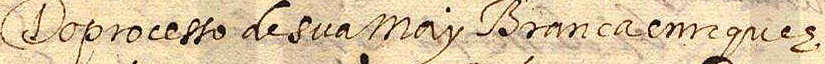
Do processo de sua may Branca enriques
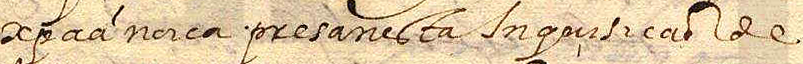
xpaā noua presa nesta Inquisiçaõ de
